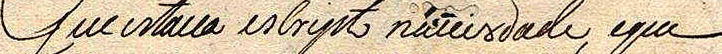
Que estaua esCripto na uerdade, e que
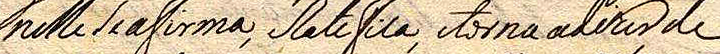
nelle se afirma, Ratefica, e torna a dizer de
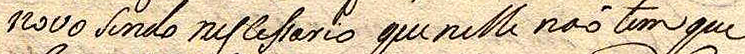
novo sendo nescessario que nelle naõ tem que
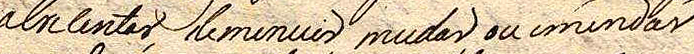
aCreCentar, deminuir, mudar, ou emendar
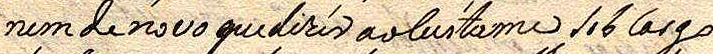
nem de novo que dizér ao Custume sob cargo
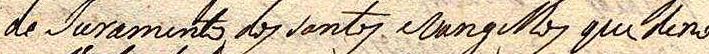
do Juramento dos santos evangelhos que de no
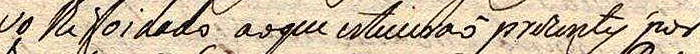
vo lhe foi dado ao que estiueraõ prezentes por
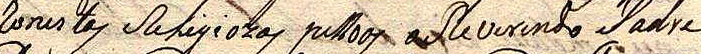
honestas e religiozas pessoas o Reverendo Padre
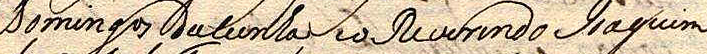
Domingos da cunha, e o Reverendo Joaquim
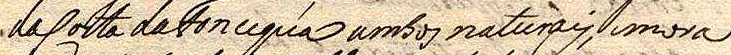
da Costa da Foncequa ambos naturais, e mora
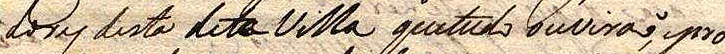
dores desta dita Villa que tudo ouviraõ, e pro
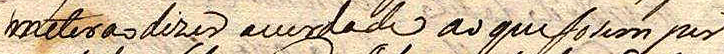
meterao dizer a uerdade, ao que fosem per
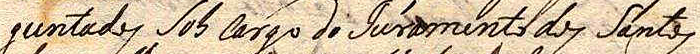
guntados sob cargo do Iuramento dos Santos
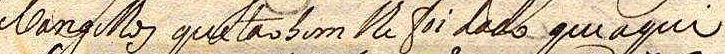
eVangelhos que taobem lhe foi dado que aqui
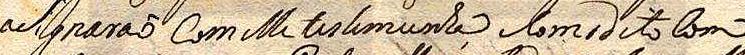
asignaraõ com elle testemunha, e com o dito Com
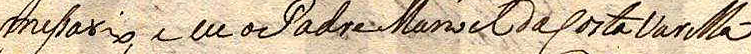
missario, e eu o Padre Manoel da Costa Varella
